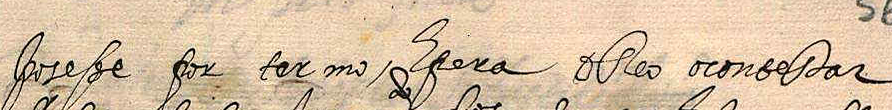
posesse por termo, E pera o Reo o contestar
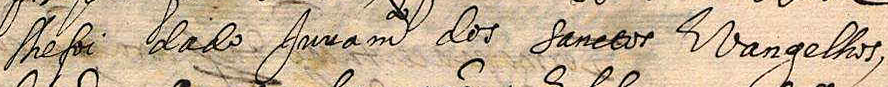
lhe foi dado Juramto dos sanctos Evangelhos,
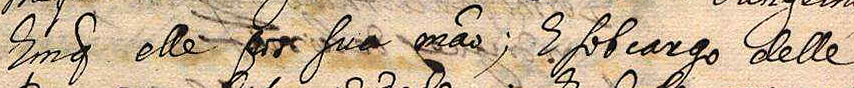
Em q̄ elle pos sua mão; E sob cargo delle
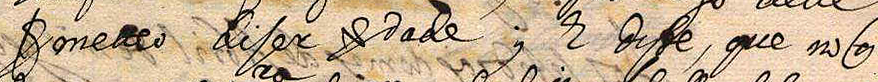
ꝓmetteo dizer ꝟdade; E disse, que no q̄
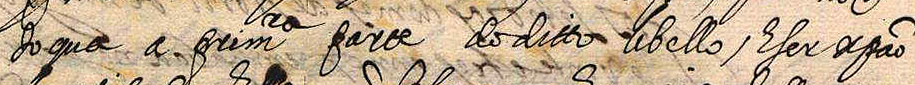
toqua a primra parte do ditto libello, E ser xpaõ
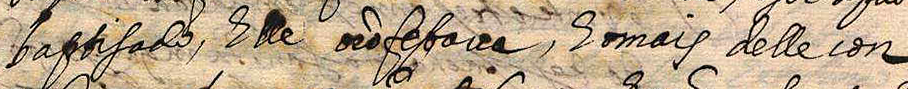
baptisado, Elle o cōfessaua, E o mais delle con
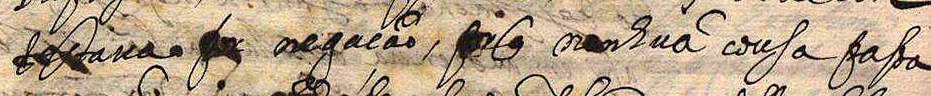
testaua por negaçaõ, porq̄ nenhuā cousa passa
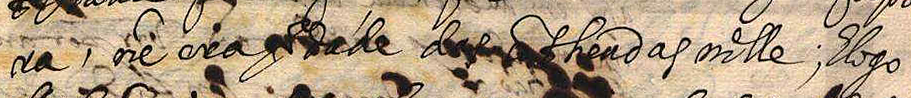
ra, nē era ꝟdade das cōtheudas nelle; E logo
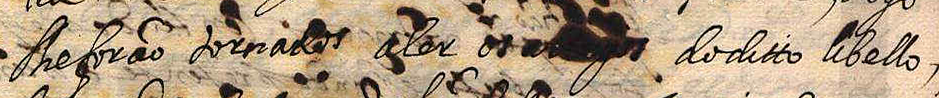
lhe foraõ tornados a ler os artigos do ditto libello,
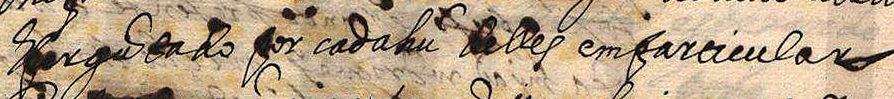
E pergūtado por cada hū delles em particular
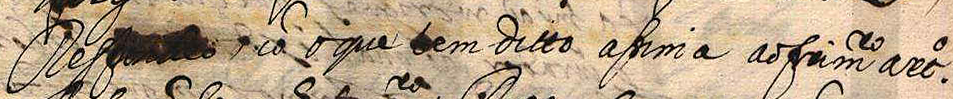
Respondeo cō o que tem ditto assima ao primro arto.
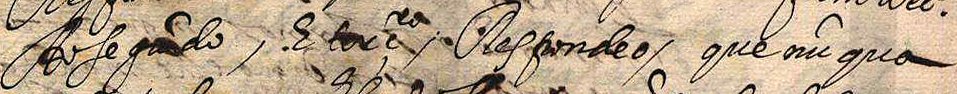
Ao segūdo, E terçro, Respondeo, que nūqua
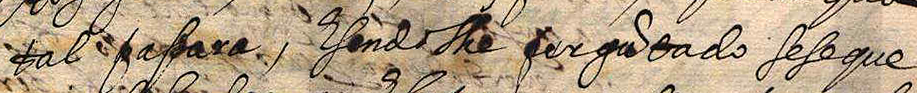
tal passara, E sendolhe pergūtado se se que
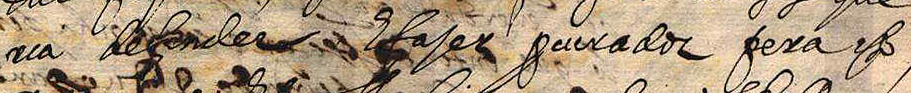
ria defender E fazer ꝓcurador pera isso;
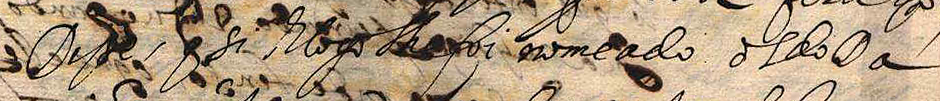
Disse, q̄ si E logo lhe foi nomeado o Ldo Da
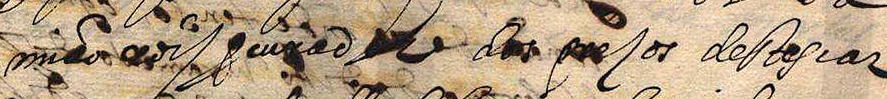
mião roīz ꝓcurador dos prezos destes car
